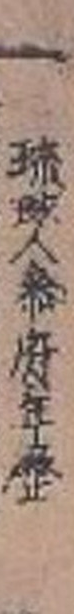琉球人参府年歴
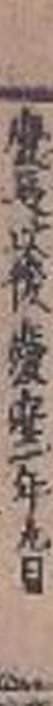慶長以後慶安二年九月
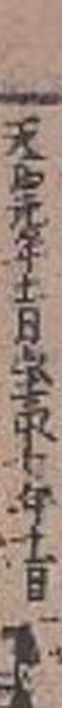天和元年十一月宝永七年十一月
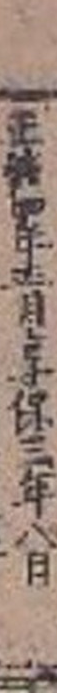正徳四年十一月享保三年八月
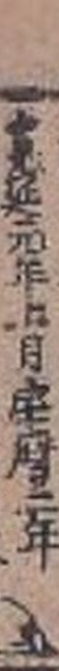寛延元年十一月宝暦二年
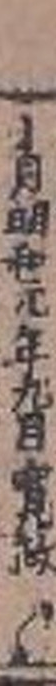十月明和元年九月寛政
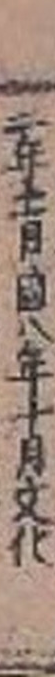二年十一月同八年十月文化
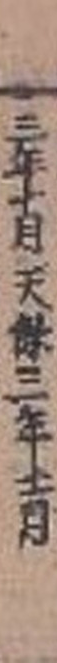三年十月天保三年十一月
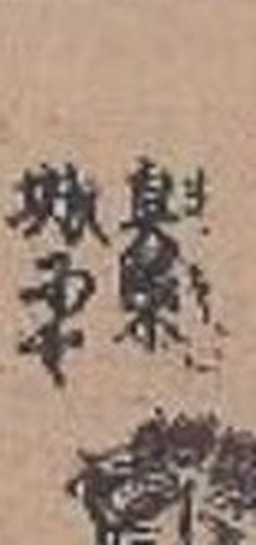城にや
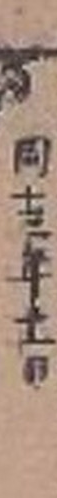同十三年十一月
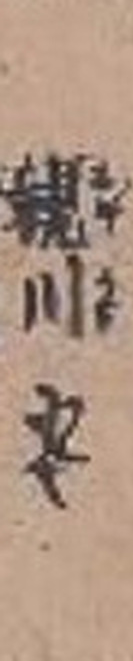親川にや
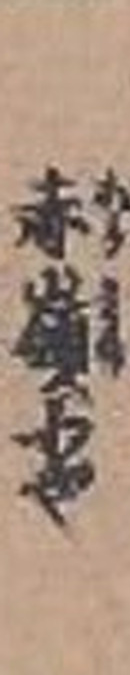赤嶺にや
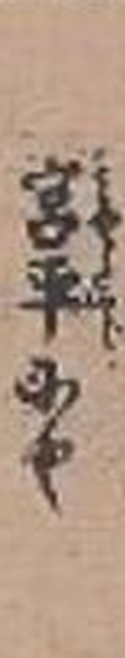宮平にや
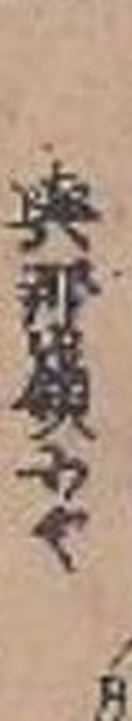與那嶺にや
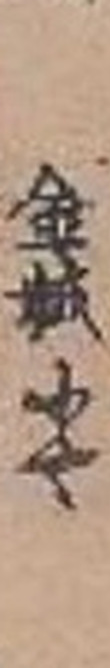金城にや
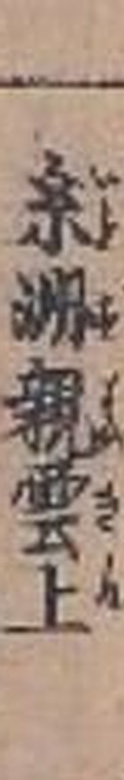糸洲親雲上
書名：琉球人行列附 天保十三壬寅年十一月
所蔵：University of the Ryukyus Library
